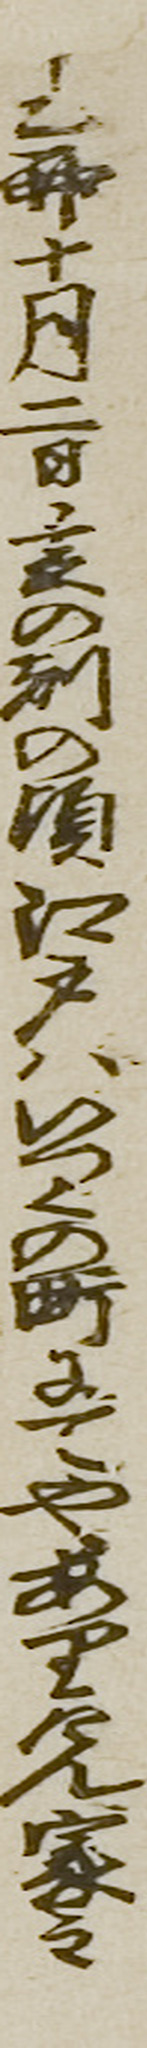安政二年卯十月二日亥の刻の頃江戸はいつくの町にてやありけん家々
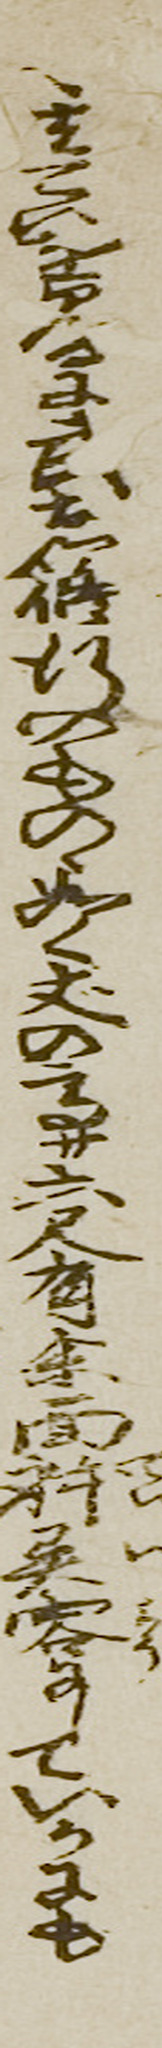其ていを見るに武者修行のものゝ如く丈の高さ六尺有余面躰異容にていかにも
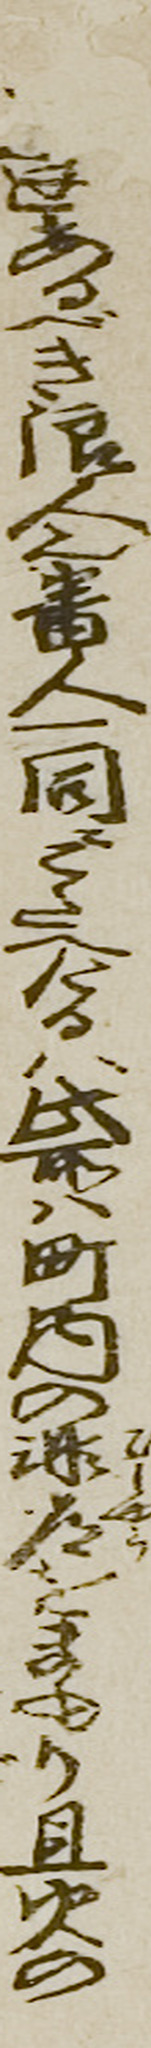一くせあるべき浪人也番人一同こたへけるは此所は町内の非常をまもり且火の
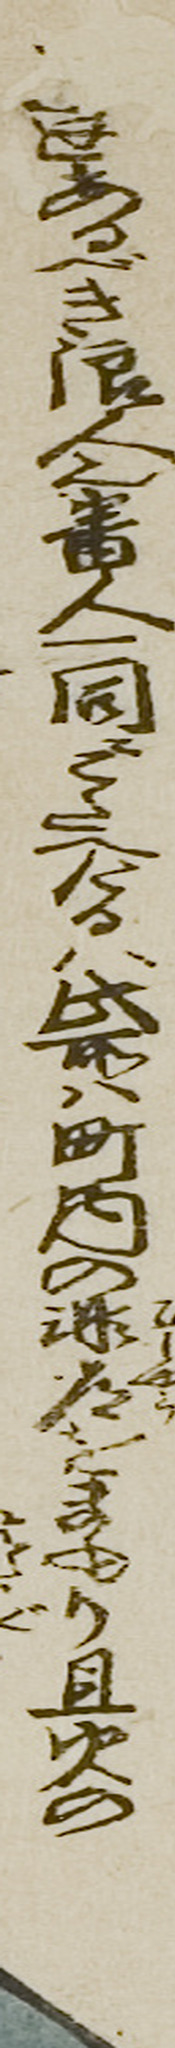一くせあるべき浪人也番人一同こたへけるは此所は町内の非常をまもり且火の
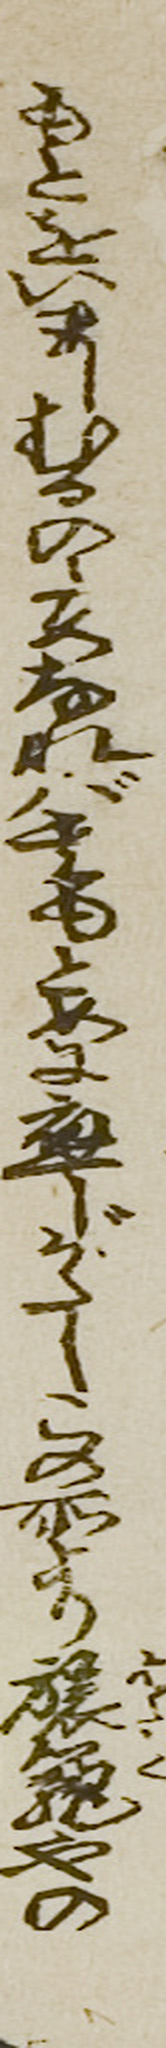もとをいましむるのためなれば其もとめに応じかたしこの所より旅籠やの
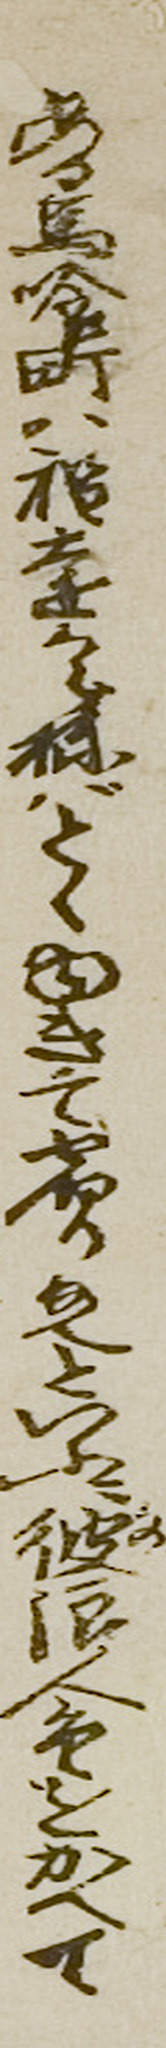ある馬喰町は程遠からねばとくゆきて宿り給へといふに彼浪人色をかへて
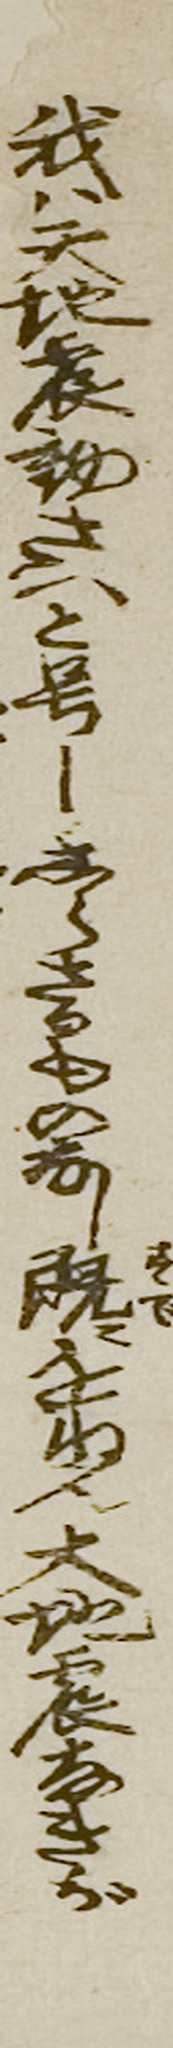我は天地震動さひと号ししらさるものなし既に懸ねん大地震なきが
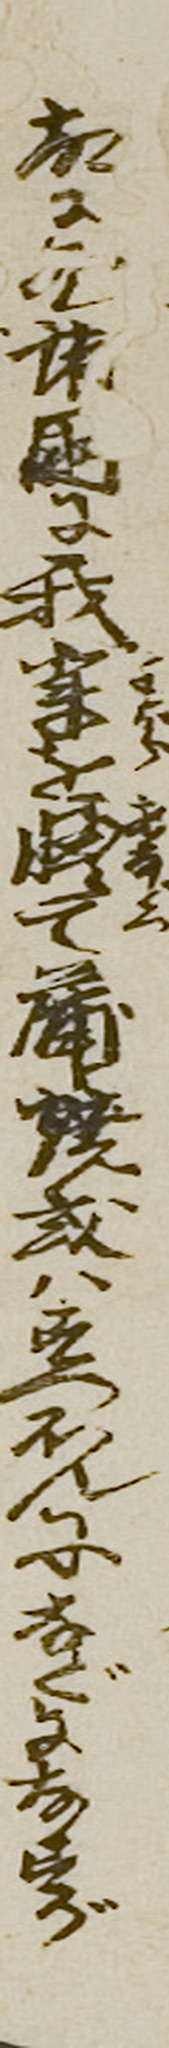故に国諸国に我輩を慢て蒲焼或いはすつほんになどになすが
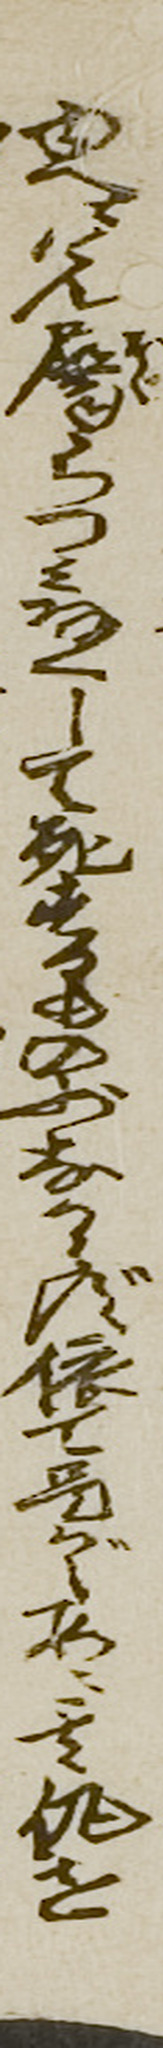ゆへにけん属らつみなくして死するもの少なからず依て其がしめに其仇を
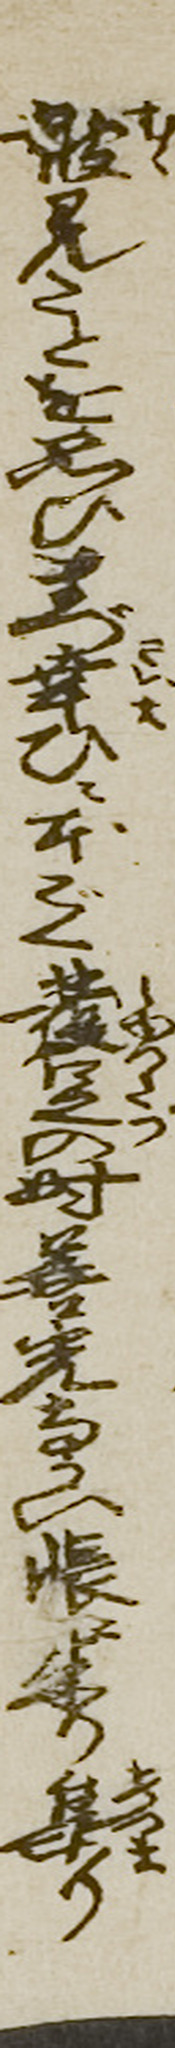報わんことを思ひまづ幸ひに本ごく発足の時善光寺かい帳に来り集り
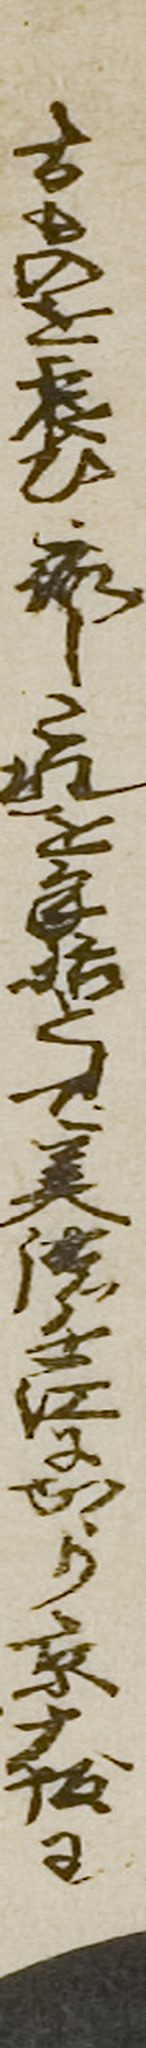たるものを震ひ落しこれを手始として美濃近江にかゝり京大坂に
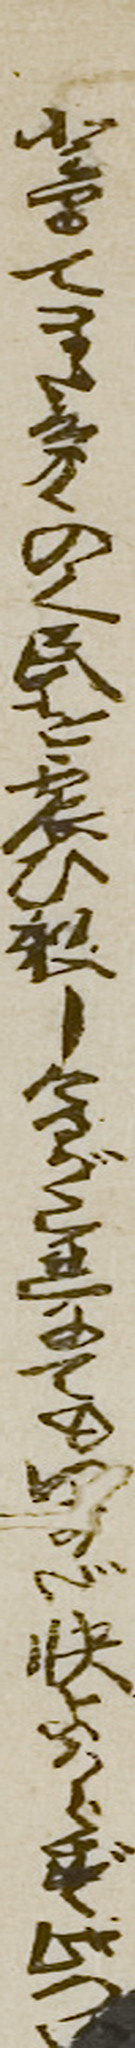登りてまた多くの人民を震ひ殺しけるがこれにてもいまだ快よからず此ついでに
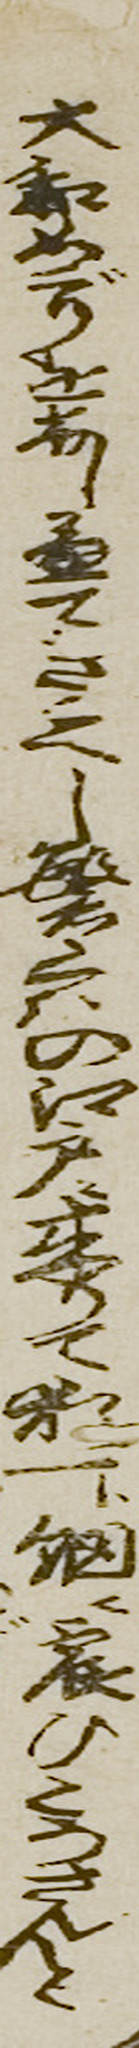大和めぐりをなし兼てきこへし繁くはの江戸に来りて猶一と細く震ひこわさんと
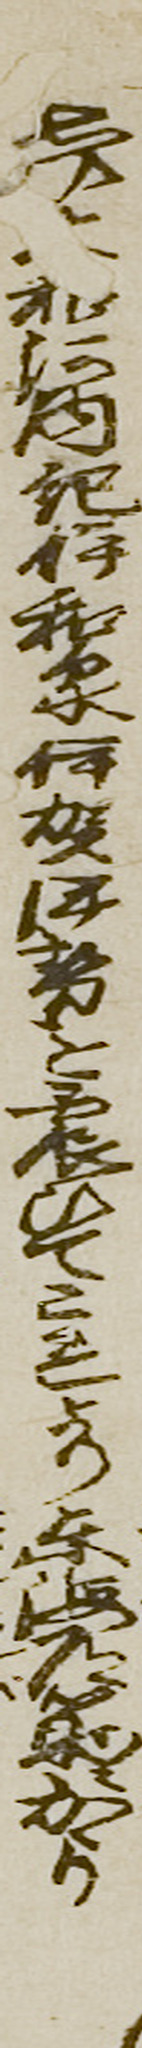思い大和河内紀伊和泉伊賀伊勢と震ひてこれより東海道筋にかゝり
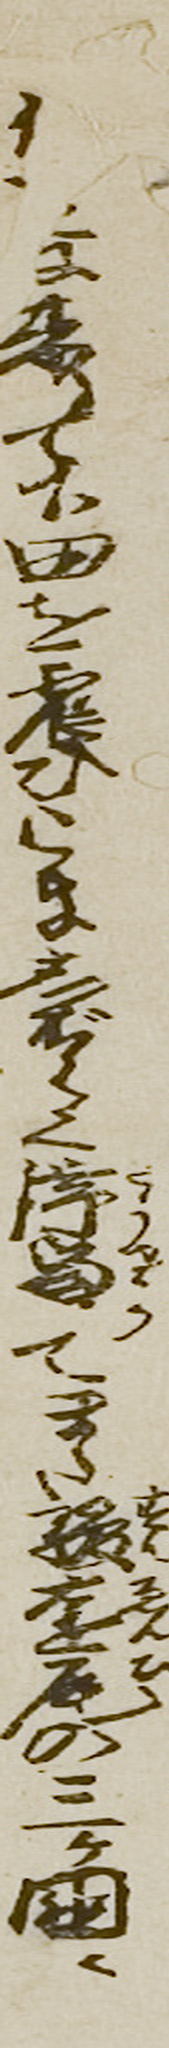伊豆に来りて下田を震ひゝしにしばらく停留てまた駿遠尾の三か国に
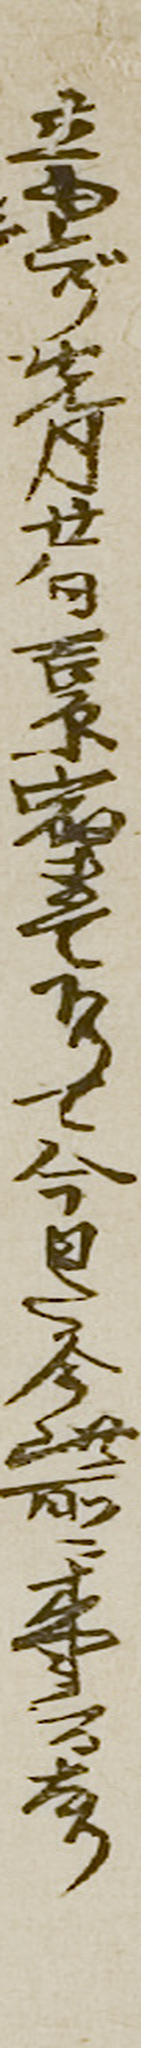立もどり先月廿の日吉原宿まて下りて今日たゝ今此所に来たるなり
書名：鯰之讎討
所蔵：東京大学総合図書館 General Library in the University of Tokyo, JAPAN
